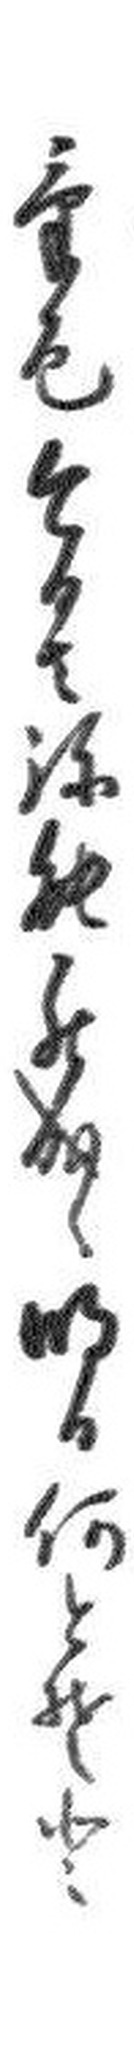気色今日者弥能罷成候明日何とそ登
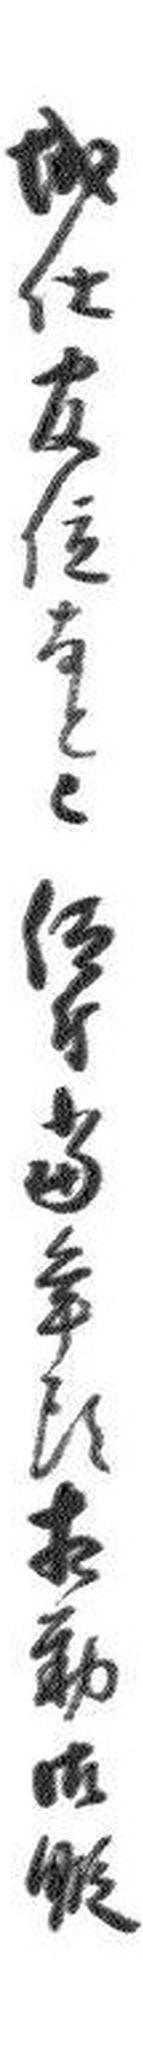城仕官位なと被仰付当年頭相勤御暇

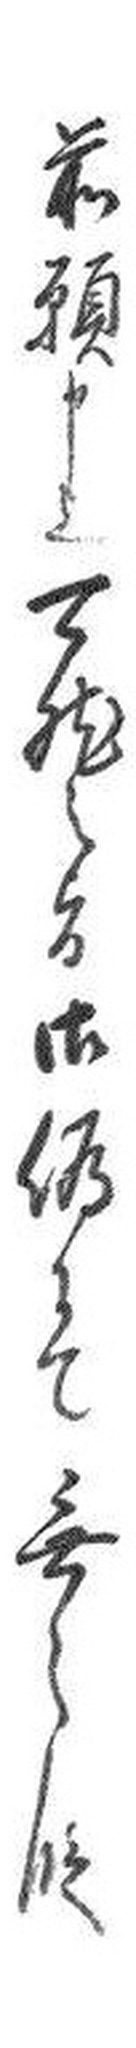前願申上可然之旨御偽にて無之段
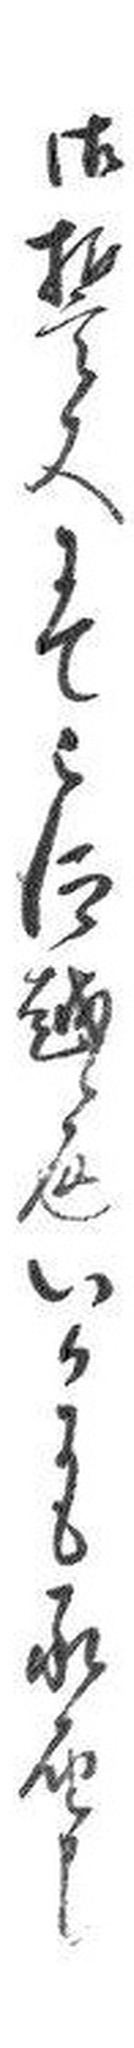御誓文にて被仰越候通いかにも承届申候
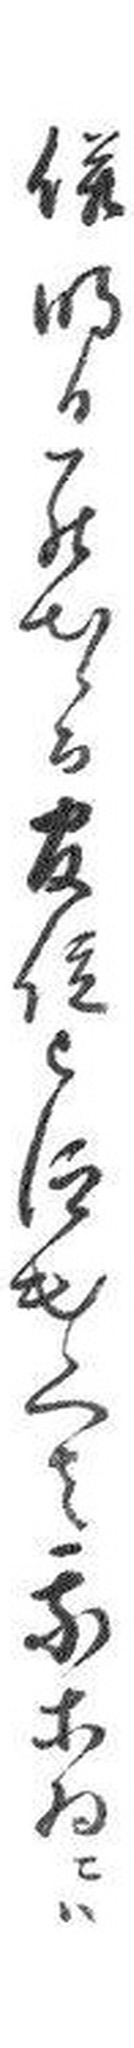併明日罷出候而官位被仰出候へ者我等為ニハ
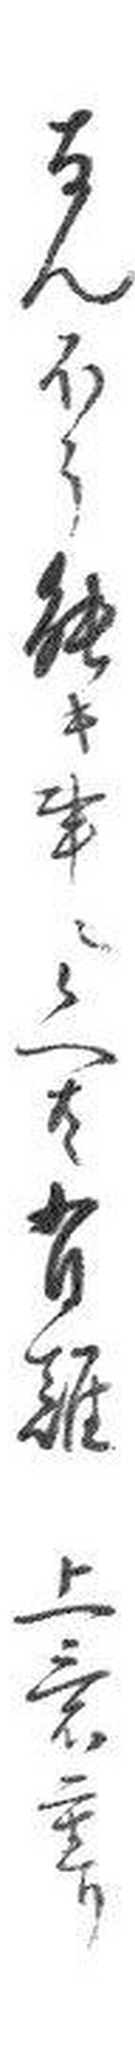なんほう能キ事ニ候へ共有難上意重り
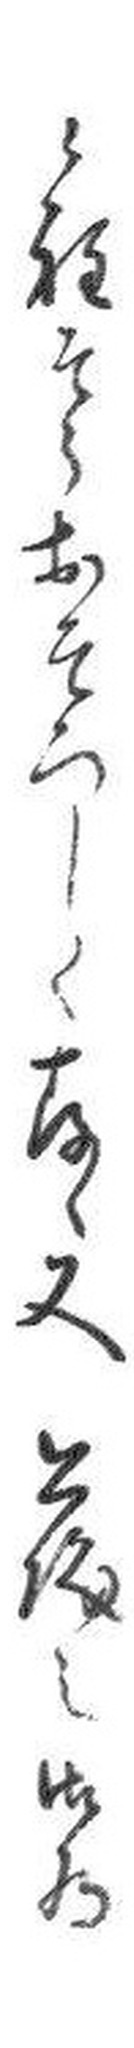候程そらおそろしく存候又公儀之御為
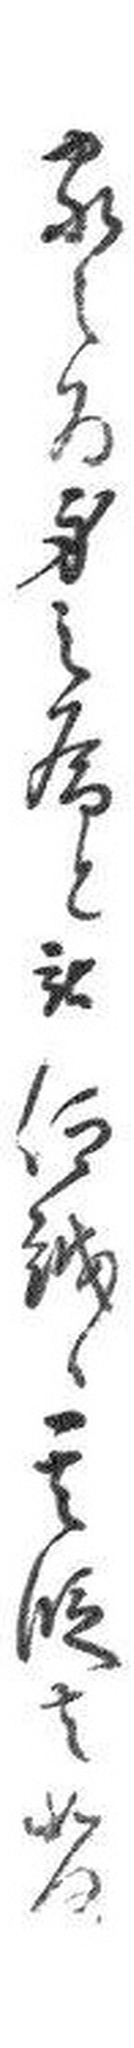家之為身之為と被仰越候其段者如何
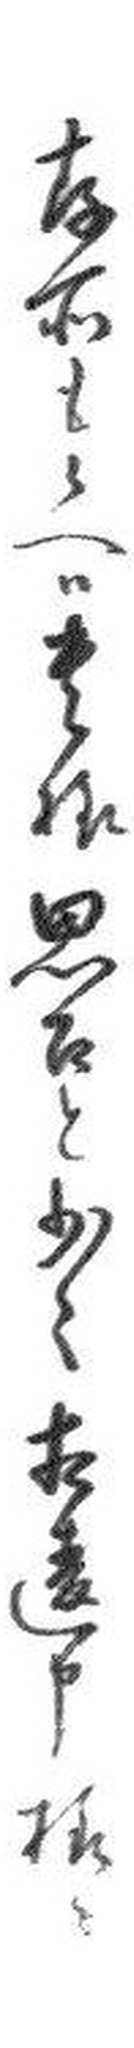存所も候へㇵ貴様思召と少々相違申様ニ
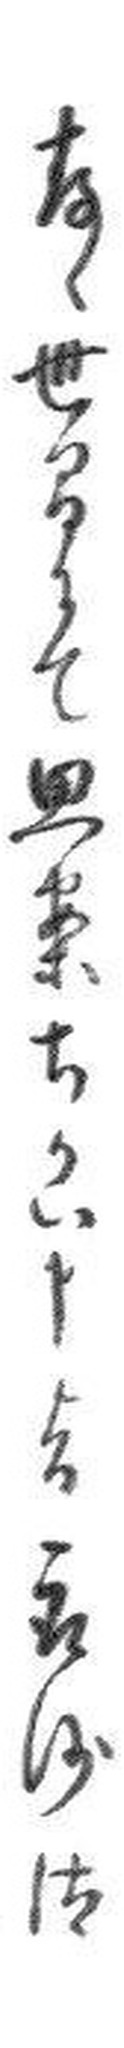存候世間にて思案ちかい申旨取沙汰
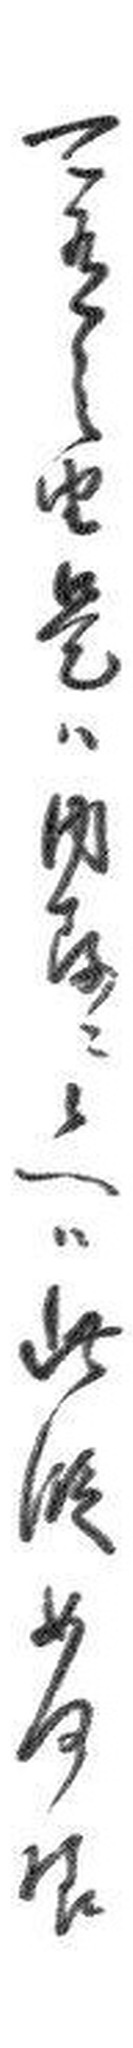可有之由是ㇵ内存ニ候へㇵ此段如何様
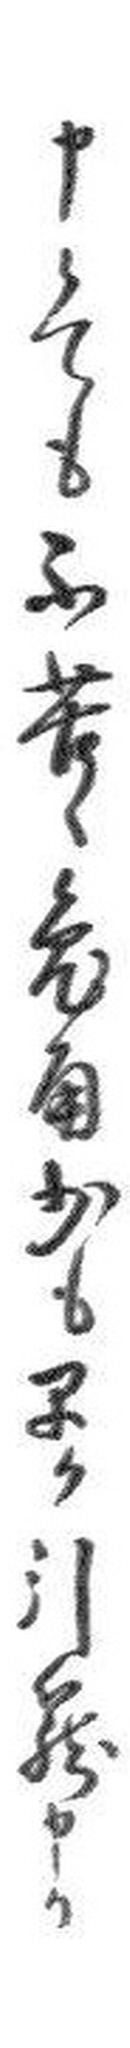申候ても不苦候兎角少も早ク引籠申か
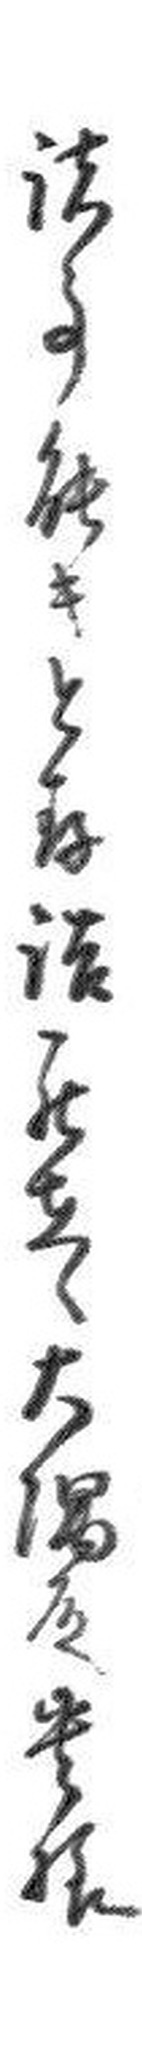諸事能キと存詰罷在候大隅殿貴様
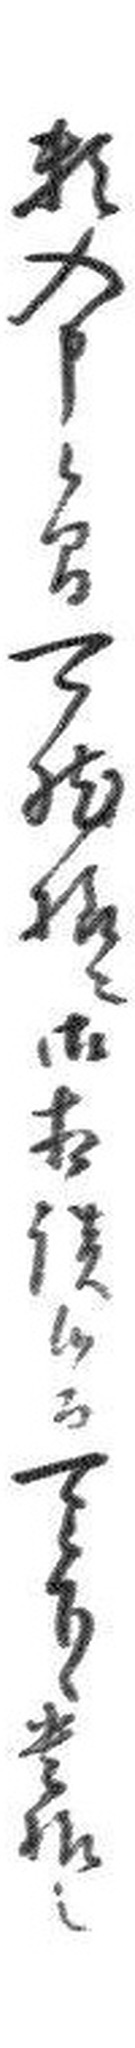頼入申候間可然様ニ御相談候而可被下候貴様之
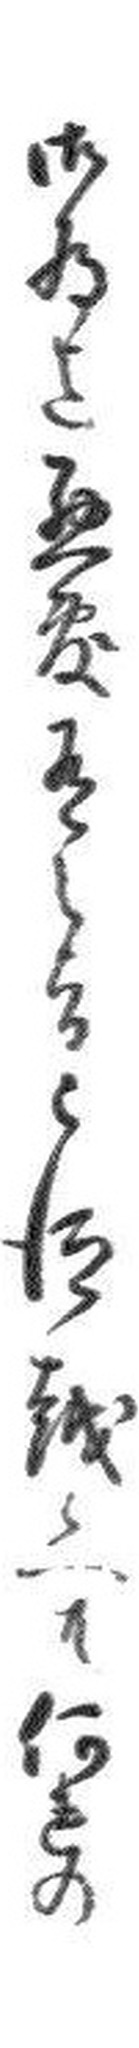御為迄悪敷有之旨被仰越候へ共何れの
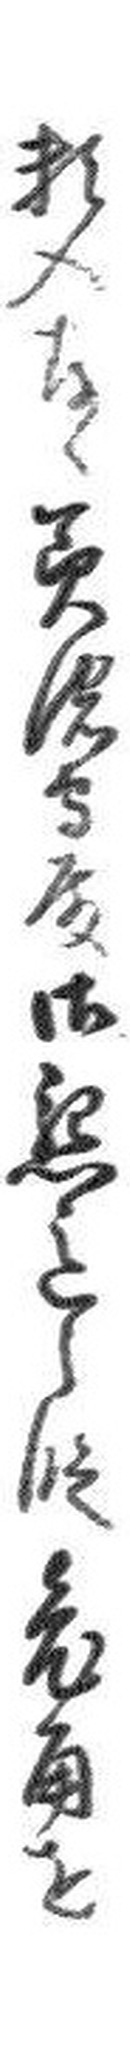頼入存候美濃守殿御懇意之段兎角を
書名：家譜 十一 昌親公 従延宝二年到延宝四年八月
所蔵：福井県文書館 Fukui Prefectural Archives
